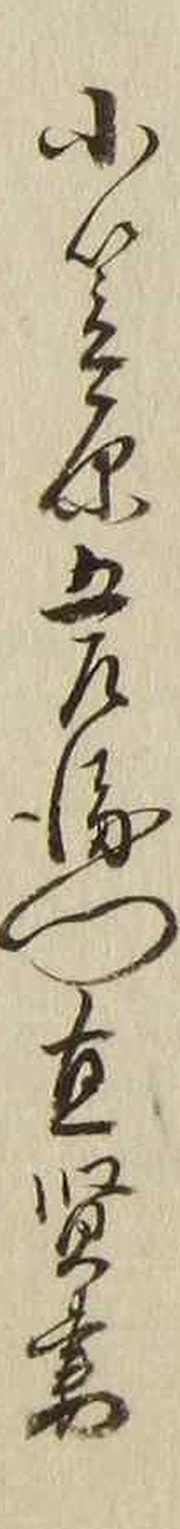女小笠原五左衛門直賢妻

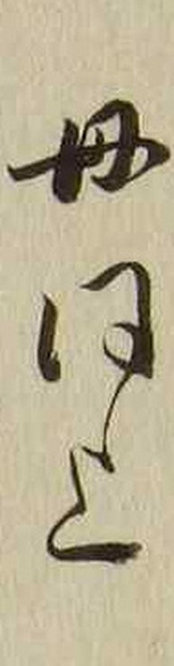母同上
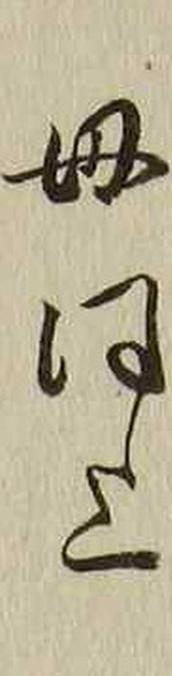母同上
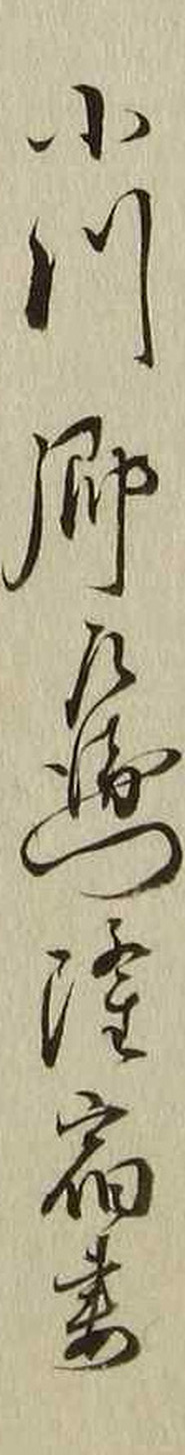女小川郷左衛門降宿妻
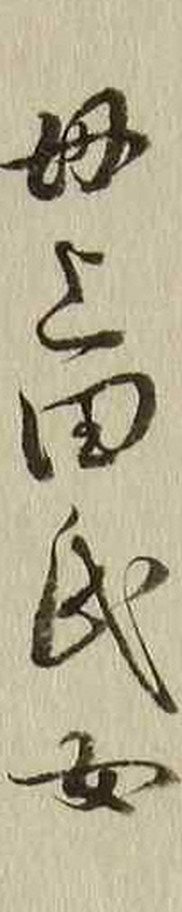母上田氏女
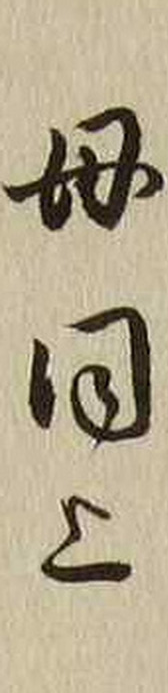母同上
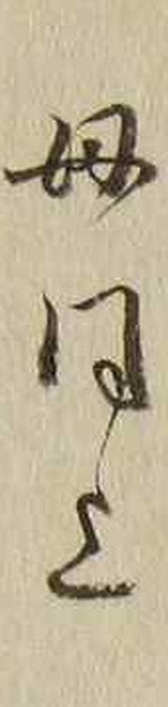母同上

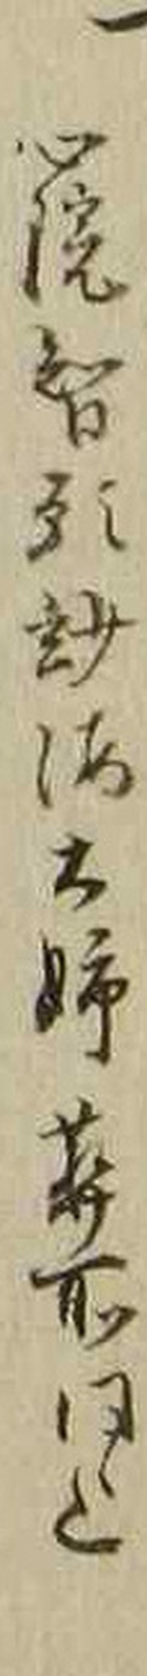心院智願玅海大姉葬所同上
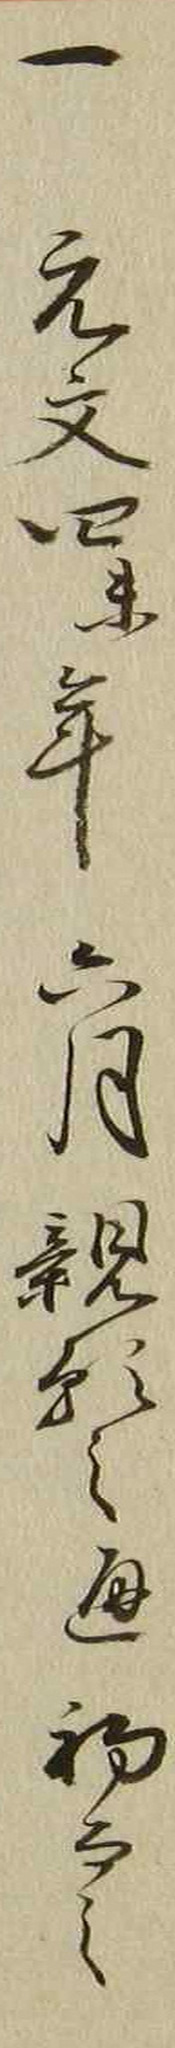一元文四未年六月親願之通初而之
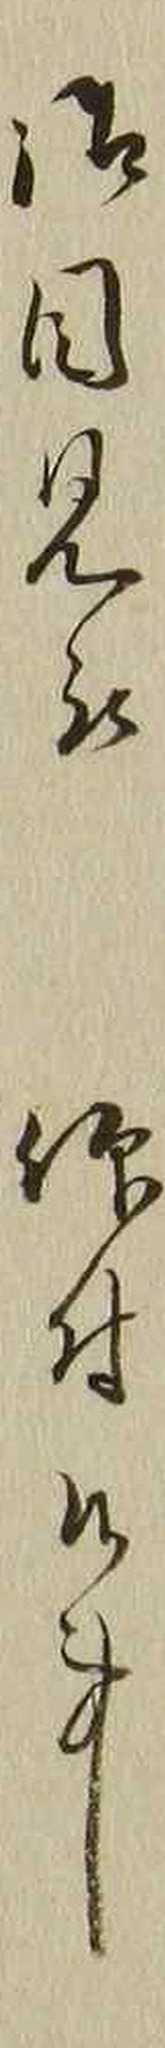御目見被仰付候事
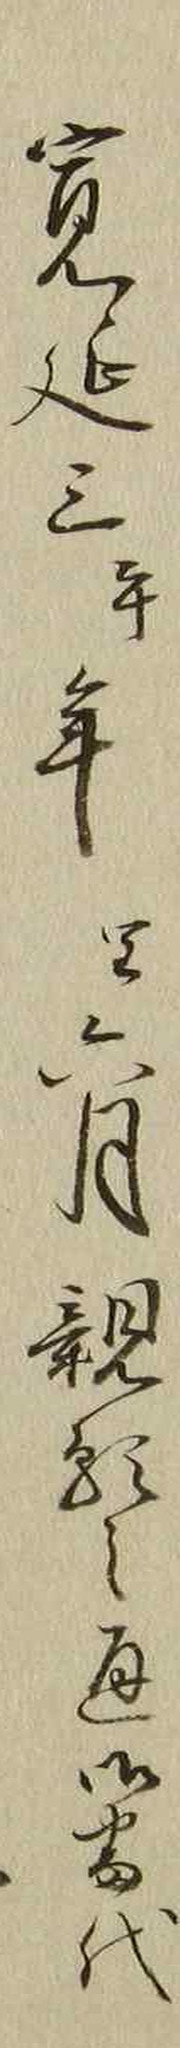一寛延三午年閏六月親願之通御番代
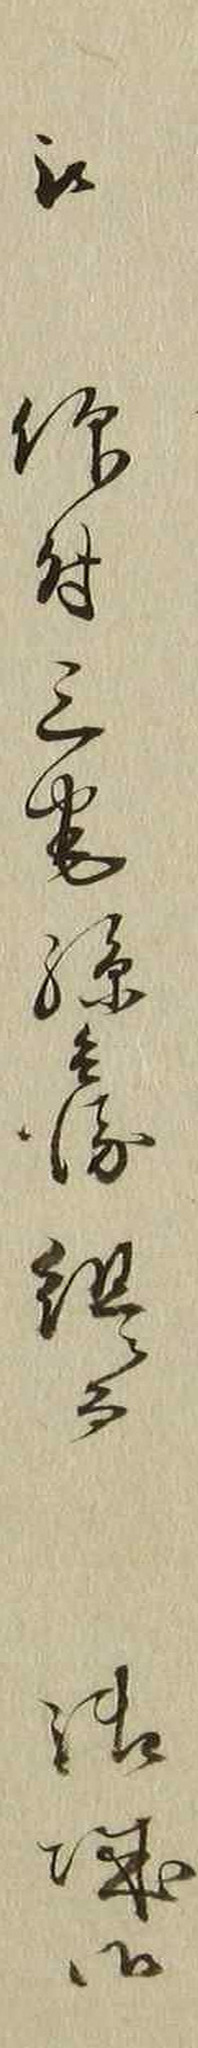被仰付三宅孫兵衛組ニ而御城御
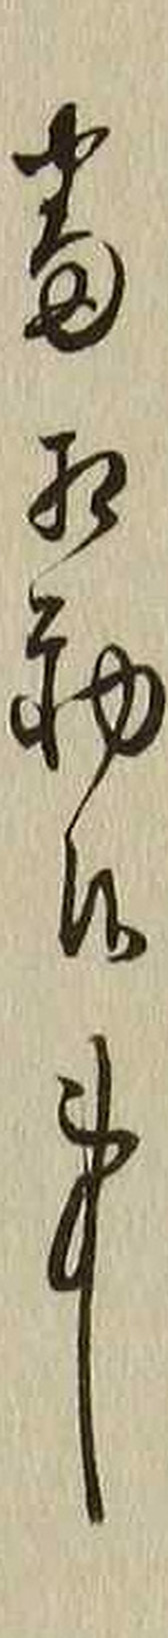番相勤候事
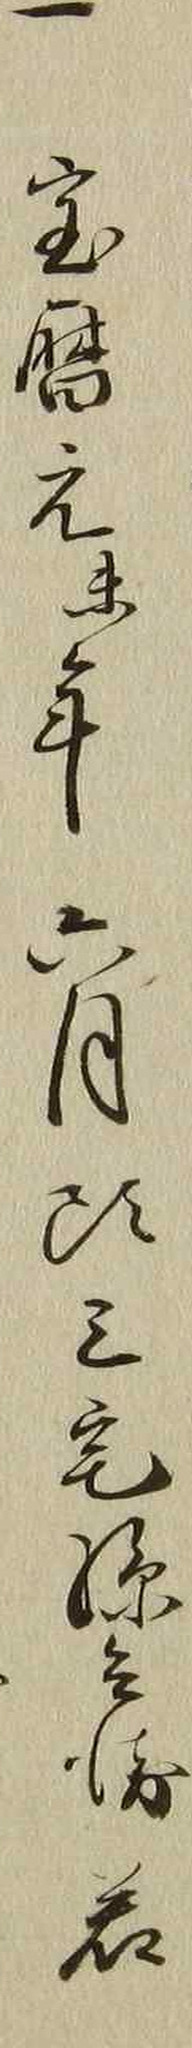一宝暦元未年六月頭三宅孫兵衛若
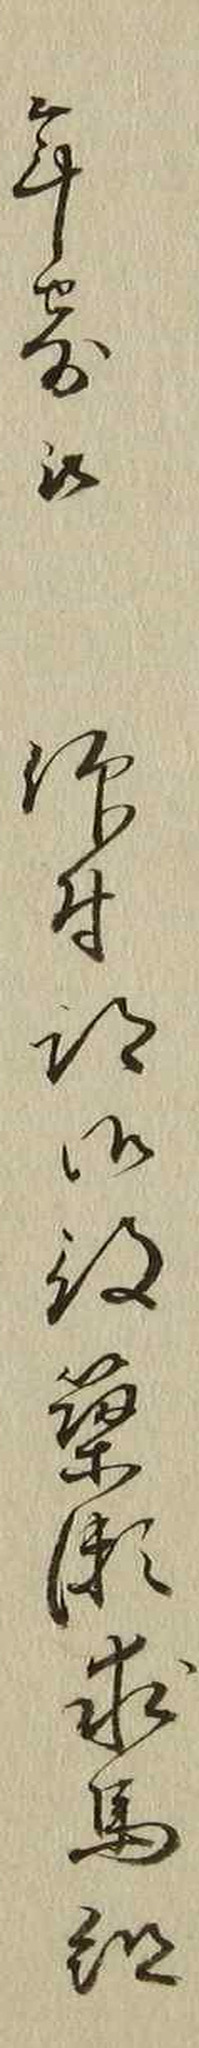年寄被仰付跡御役簗瀬求馬組
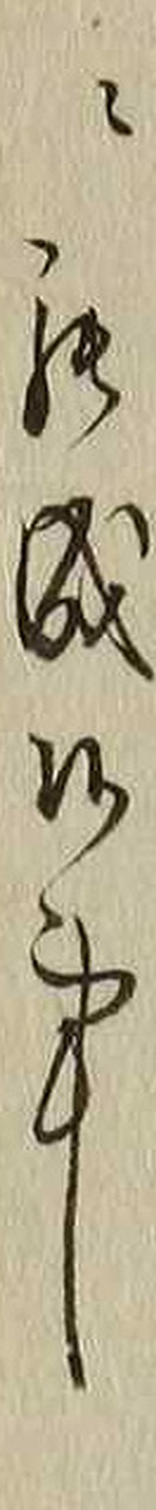ニ罷成候事
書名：諸士系譜　巻之68　を之部2
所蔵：会津若松市立会津図書館
